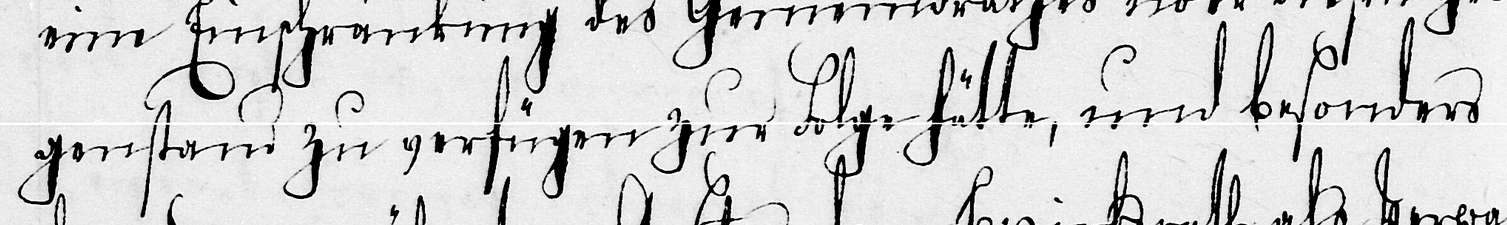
genstand zu verfügen zur Folge hätte, und besonders
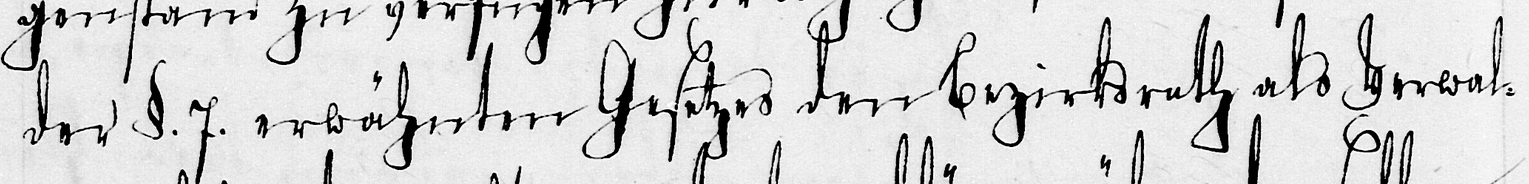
der §. 7. erwähnten Gesetzes den Bezirksrath als Verwal¬
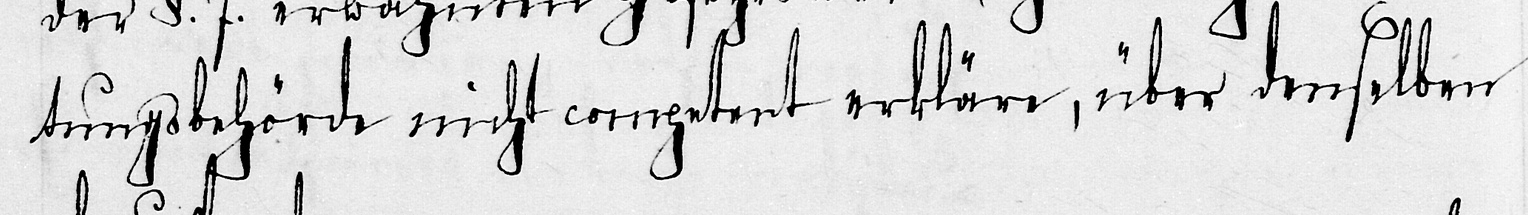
tungsbehörde nicht competent erkläre, über denselben
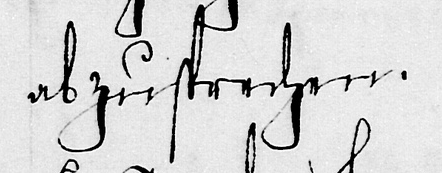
abzusprechen.
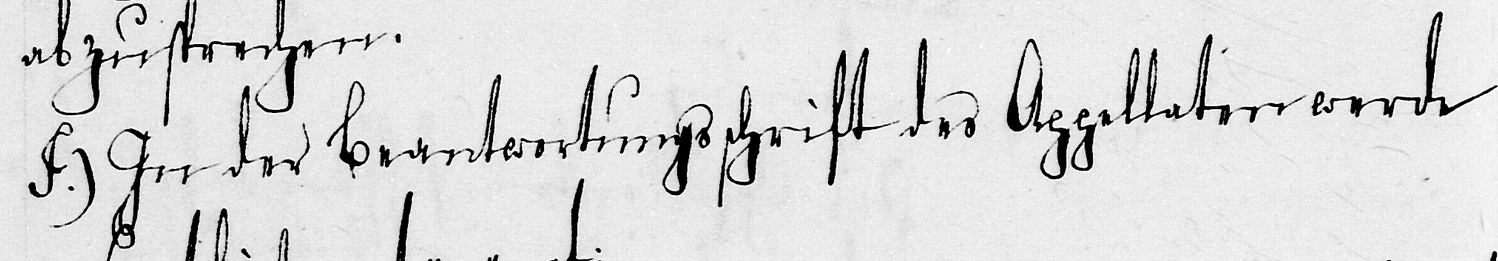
F.) In der Beantwortungsschrift des Appellaten werde
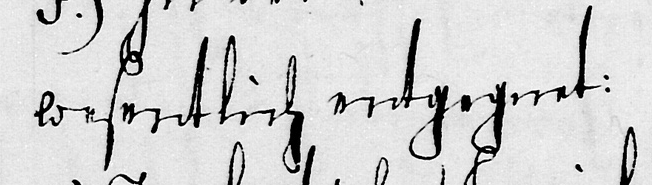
wesentlich entgegnet:
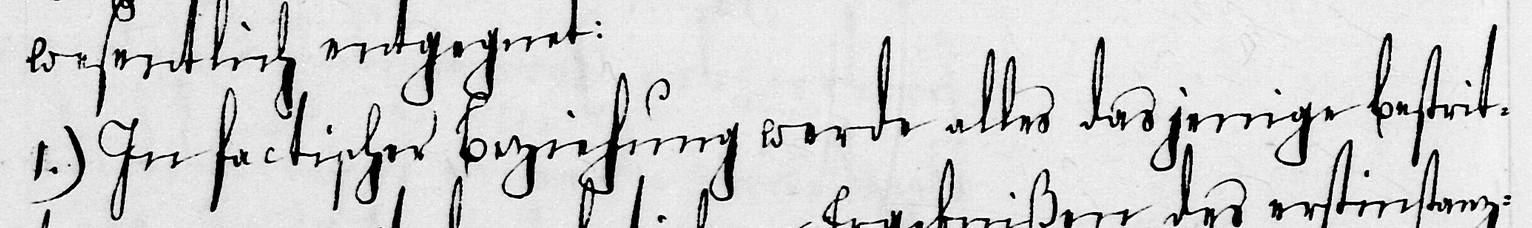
1.) In factischer Beziehung werde alles dasjenige bestrit¬
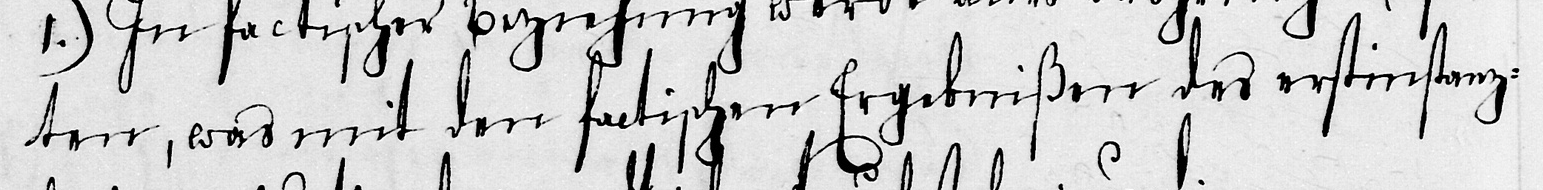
ten, was mit den factischen Ergebnißen des erstinstanz¬
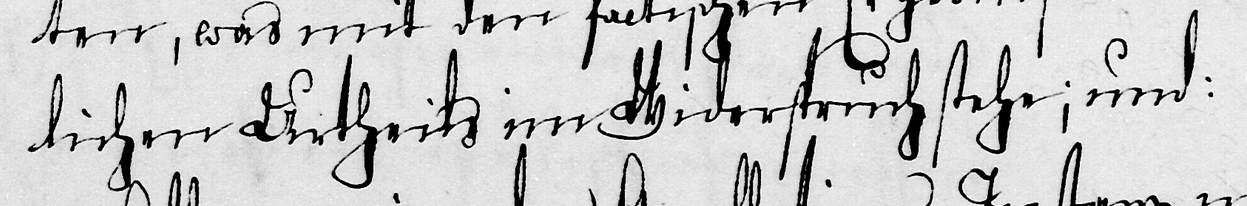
lichen Urtheils im Widerspruch stehe; und:
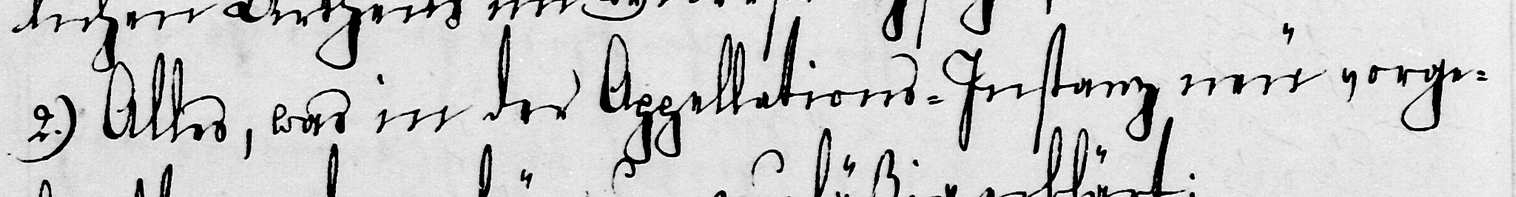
2.) Alles, was in der Appellations-Instanz neu vorge¬
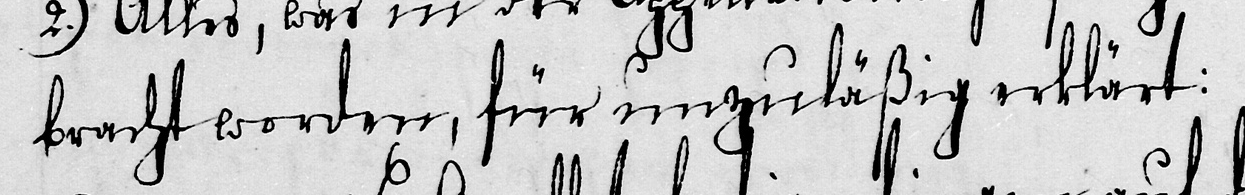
bracht worden, für unzuläßig erklärt:
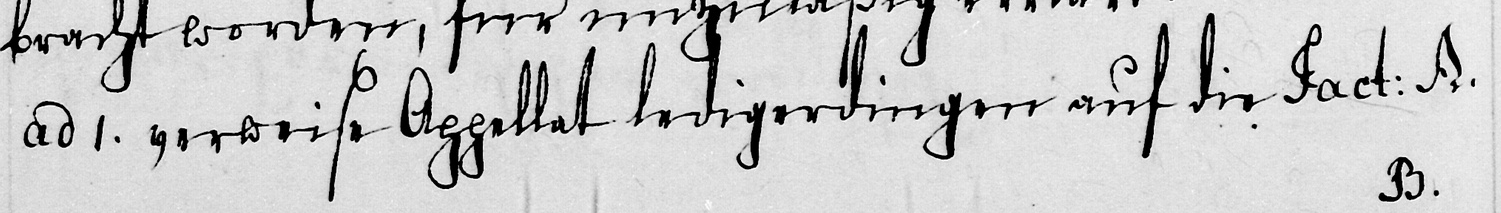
ad 1. verweise Appellat ledigerdingen auf die Fact: A.
